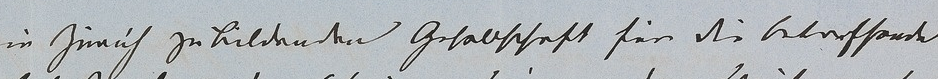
in Zürich zu bildenden Gesellschaft für die betreffende
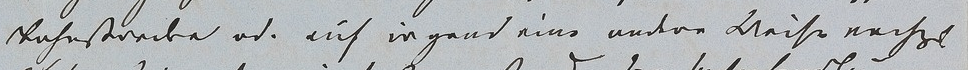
Bahnstrecke od. auf irgend eine andere Weise nachzu-
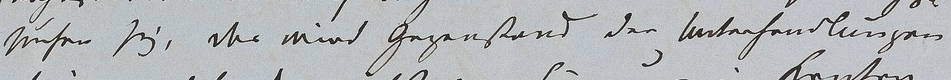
suchen sey, das wird Gegenstand der Unterhandlungen
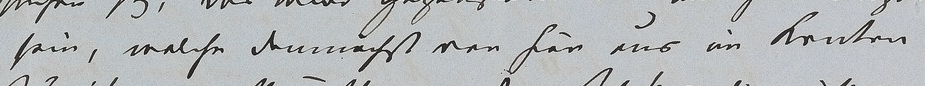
sein, welche demnächst von hier aus im Kanton
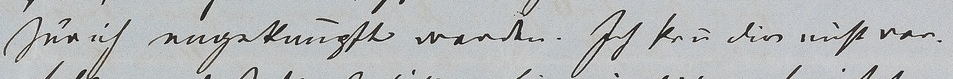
Zürich angeknüpft werden. Ich kann dir nicht ver-
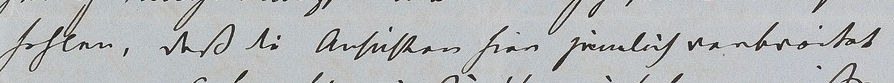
hehlen, daß die Ansichten hier ziemlich verbreitet
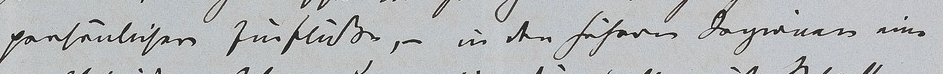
persönlicher Einflüße, – in den höhern Regionen eine
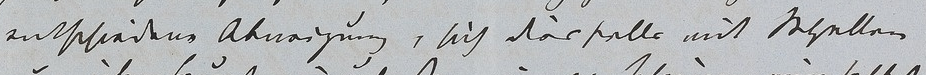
entschiedene Abneigung, sich diesfalls mit St Gallen
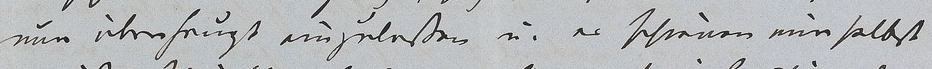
nur überhaupt einzulaßen u. es schienen mir selbst
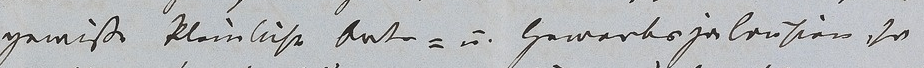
gewiße kleinliche Orts- u. Gewerbsjalousien so-
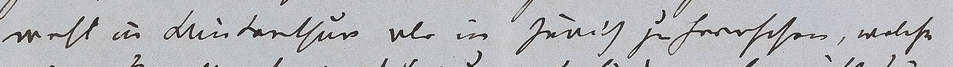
wohl in Winterthur als in Zürich zu herrschen, welche
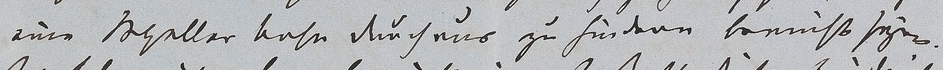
eine StGaller Bahn durchaus zu hindern bemüht seyen.
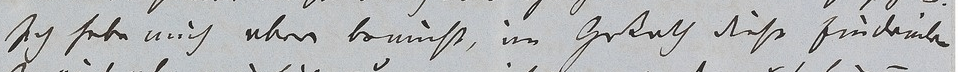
Ich habe mich aber bemüht, im Gr Rath diese Eindrücke
